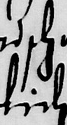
120.
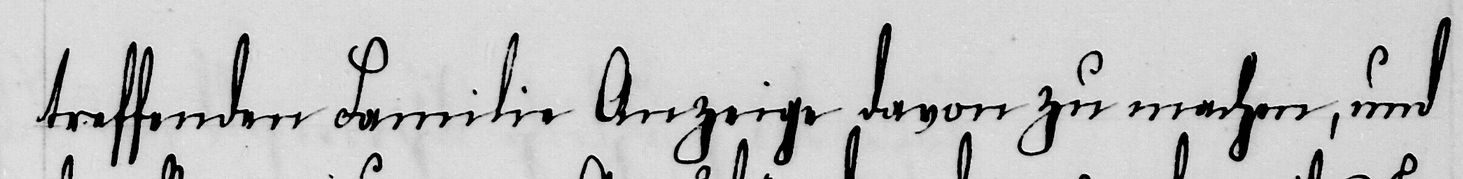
treffenden Familie Anzeige davon zu machen, und
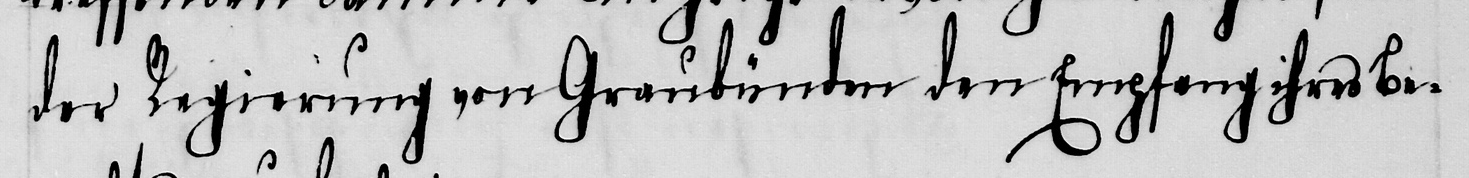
der Regierung von Graubünden den Empfang ihres Be¬
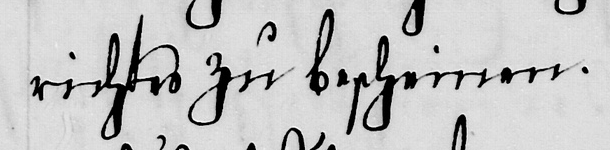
richtes zu bescheinen.
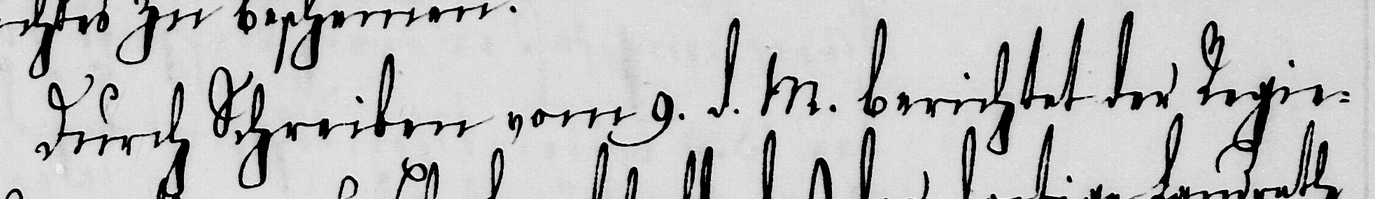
Durch Schreiben vom 9. d. M. berichtet der Regie¬
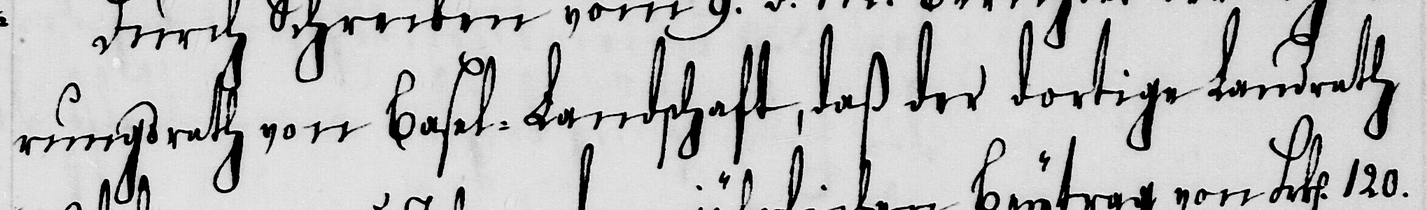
rungsrath von Basel-Landschaft, daß der dortige Landrath
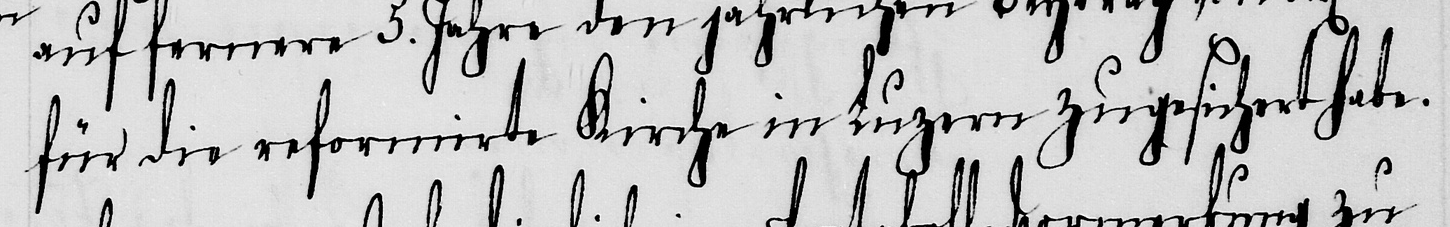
für die reformirte Kirche in Luzern zugesichert habe.
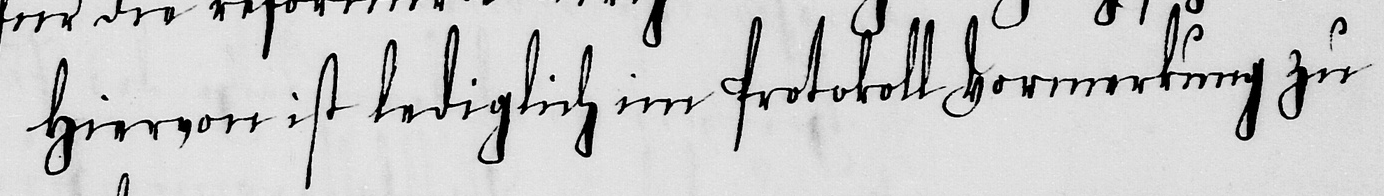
Hiervon ist lediglich im Protokoll Vormerkung zu
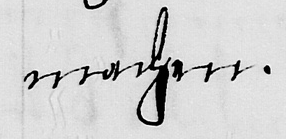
machen.
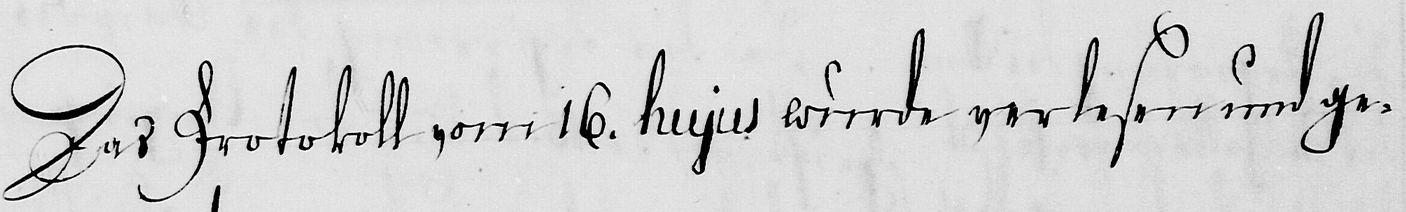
Das Protokoll vom 16. hujus wurde verlesen und ge¬
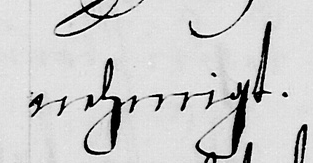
nehmigt.
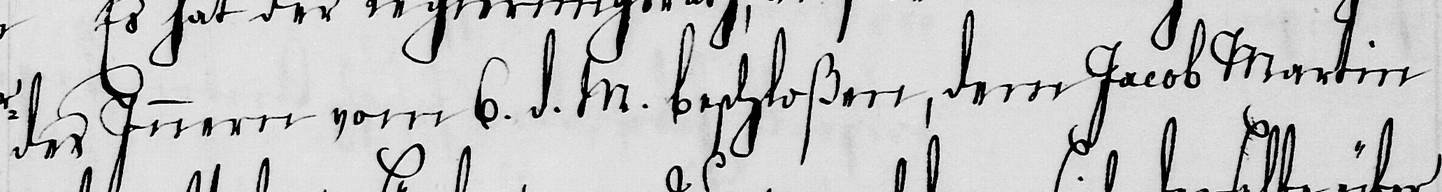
des Innern vom 6. d. M. beschloßen, dem Jacob Martin
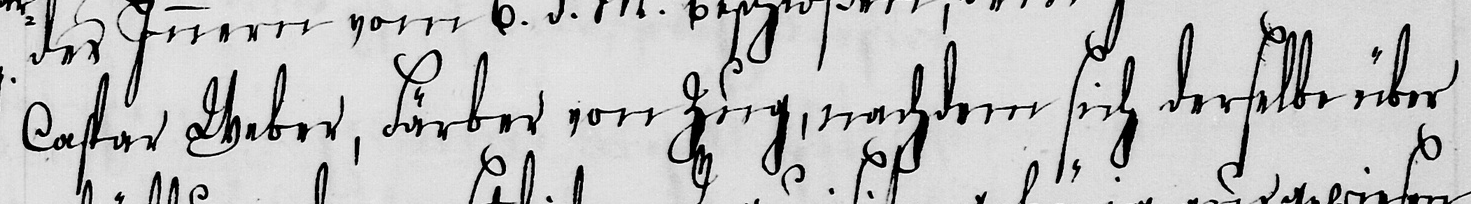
Caspar Weber, Färber von Zug, nachdem sich derselbe über
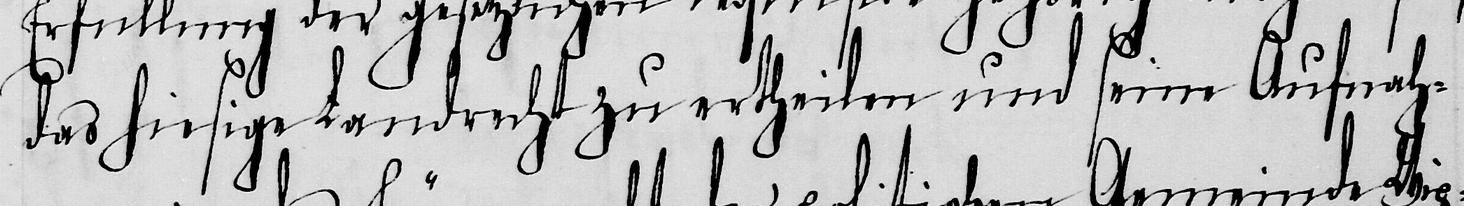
das hiesige Landrecht zu ertheilen und seine Aufnah¬
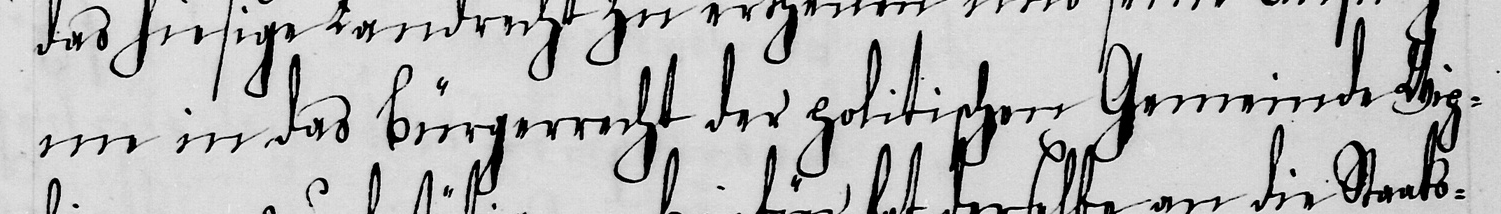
me in das Bürgerrecht der politischen Gemeinde Wip¬
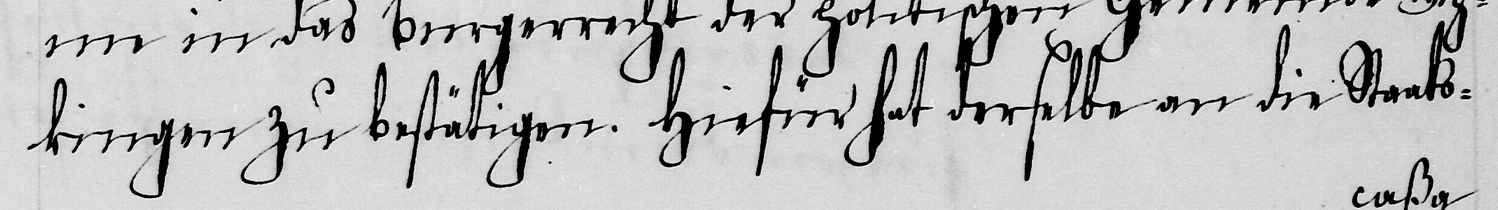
kingen zu bestätigen. Hiefür hat derselbe an die Staat¬
